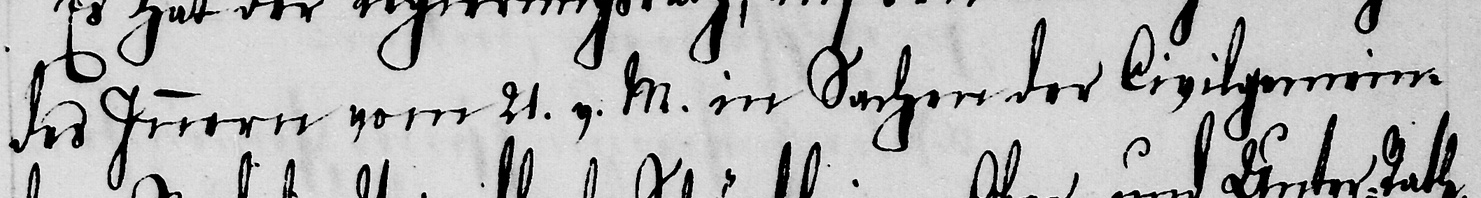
des Innern vom 21. v. M. in Sachen der Civilgemein¬
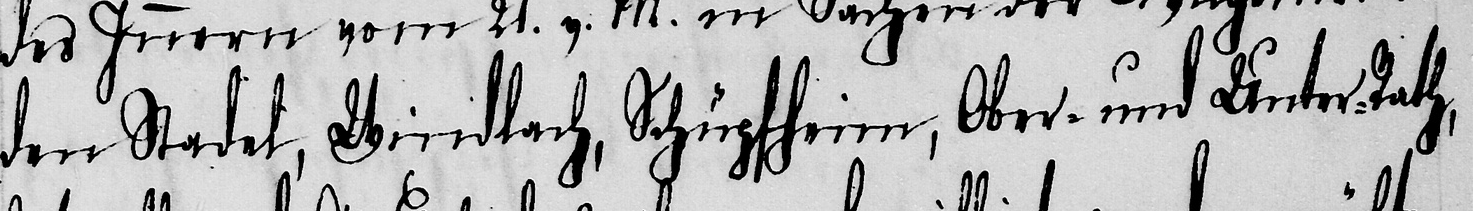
den Stadel, Windlach, Schüpfheim, Ober- und Unter-Rath,
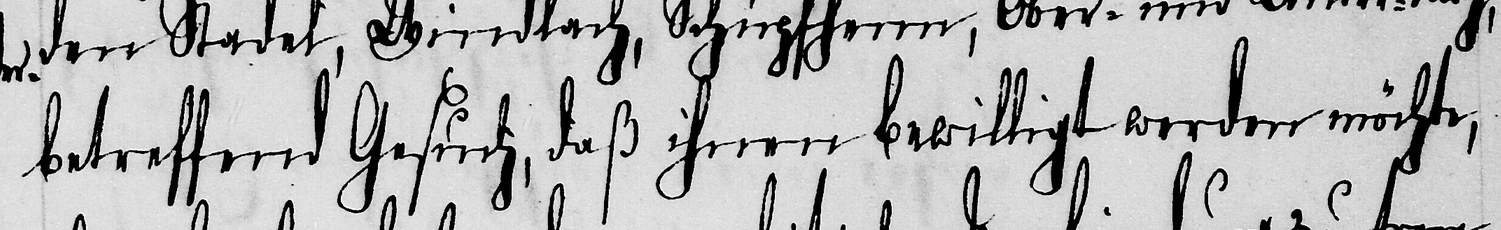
betreffend Gesuch, daß ihnen bewilligt werden möchte,
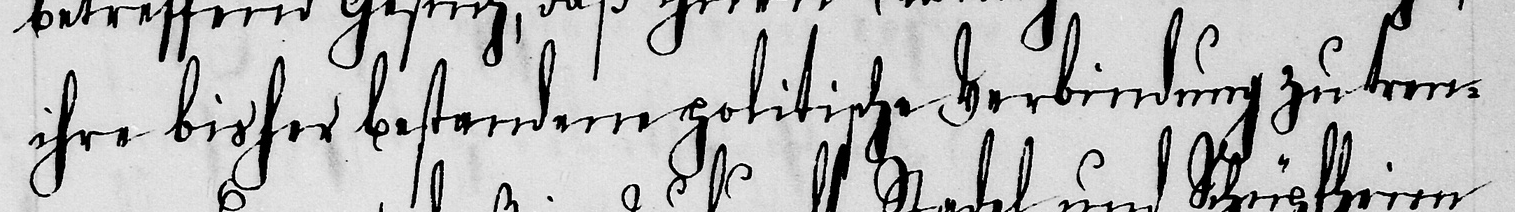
ihre bisher bestandene politische Verbindung zu tren¬
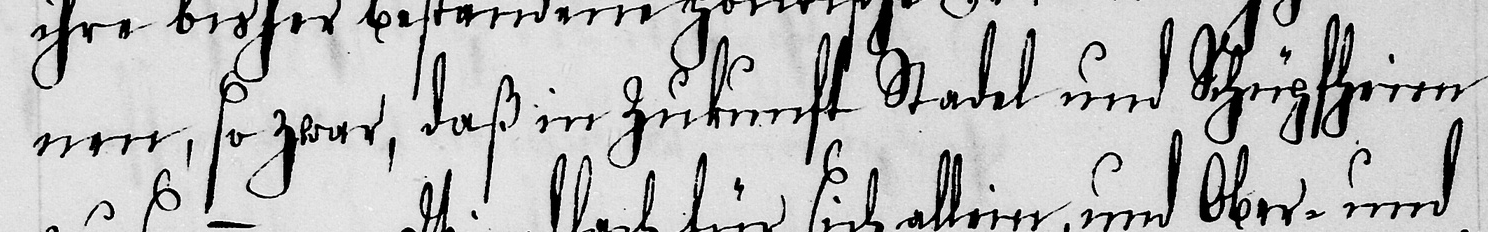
nen, so zwar, daß in Zukunft Stadel und Schüpfheim
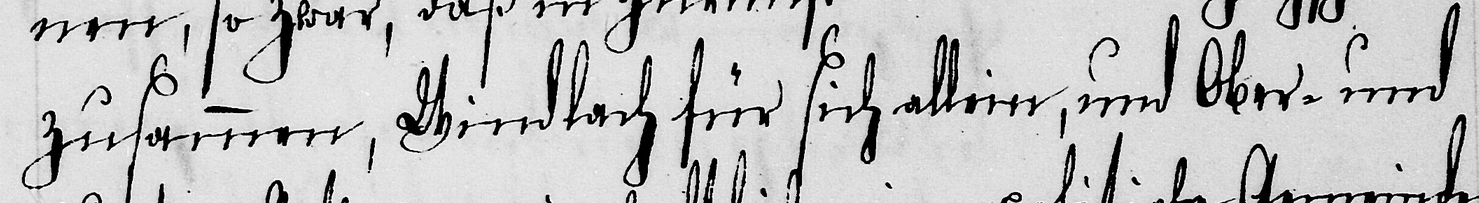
zusammen, Windlach für sich allein, und Ober- und
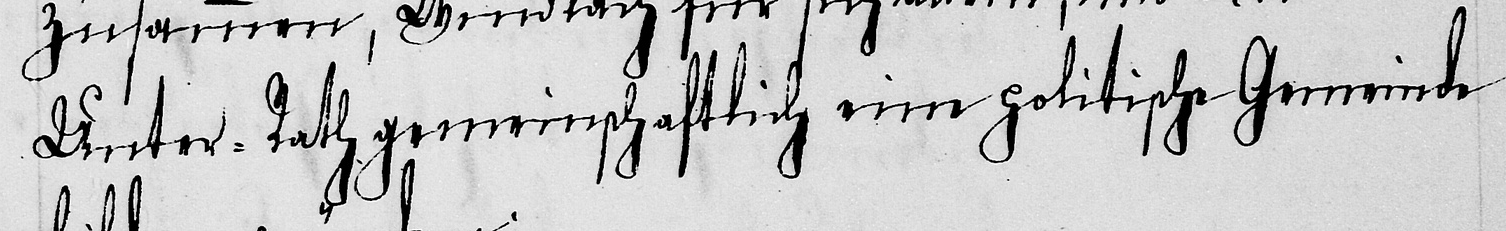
Unter-Rath gemeinschaftlich eine politische Gemeinde
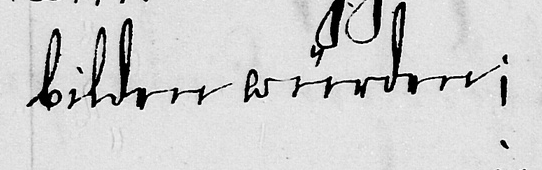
bilden würden;
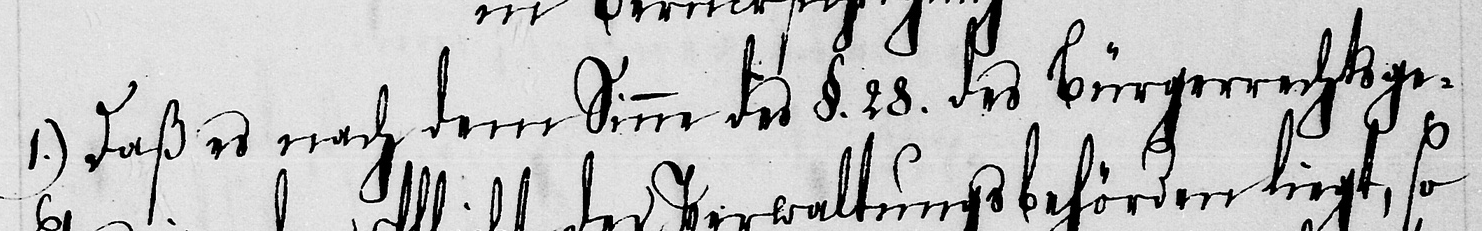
1.) Daß es nach dem Sinne des §. 28. des Bürgerrechtsge¬
